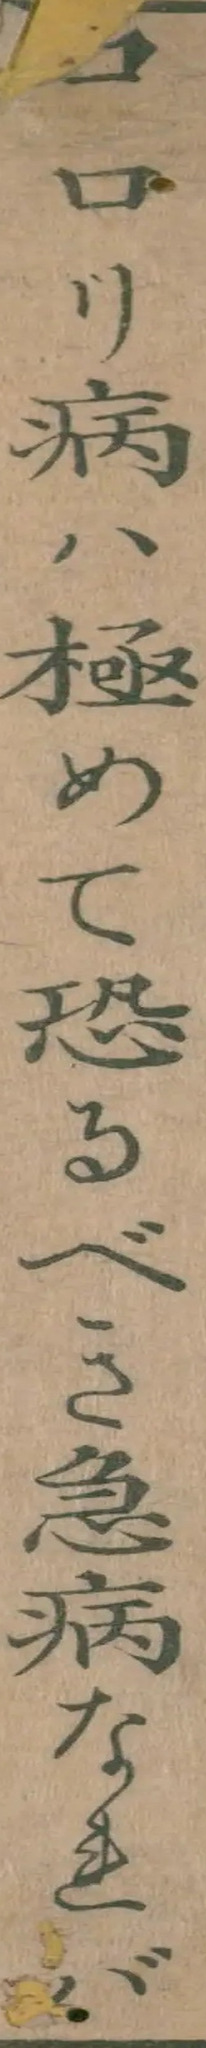コロリ病は極めて恐るべき急病なれば
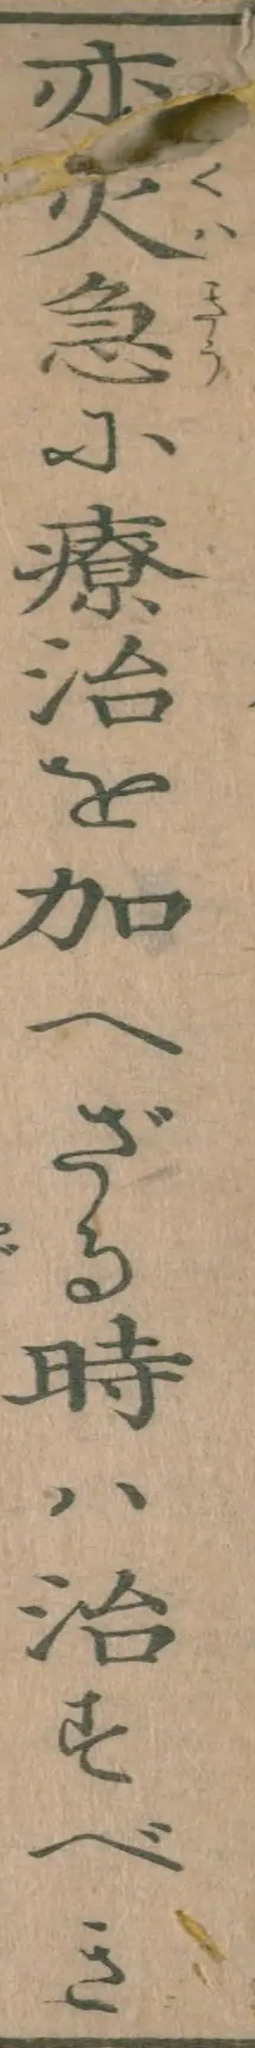亦火急に療治を加へざる時は治すべき
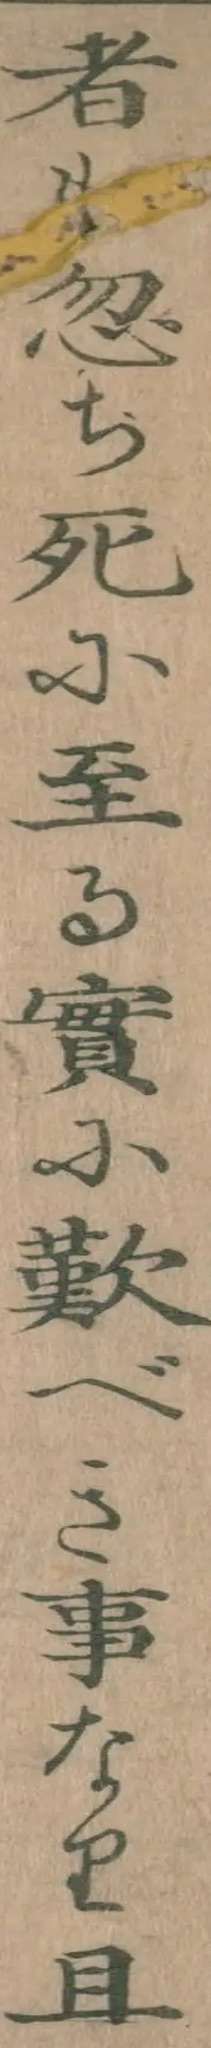者も忽ち死に至る実に歎べき事なり且
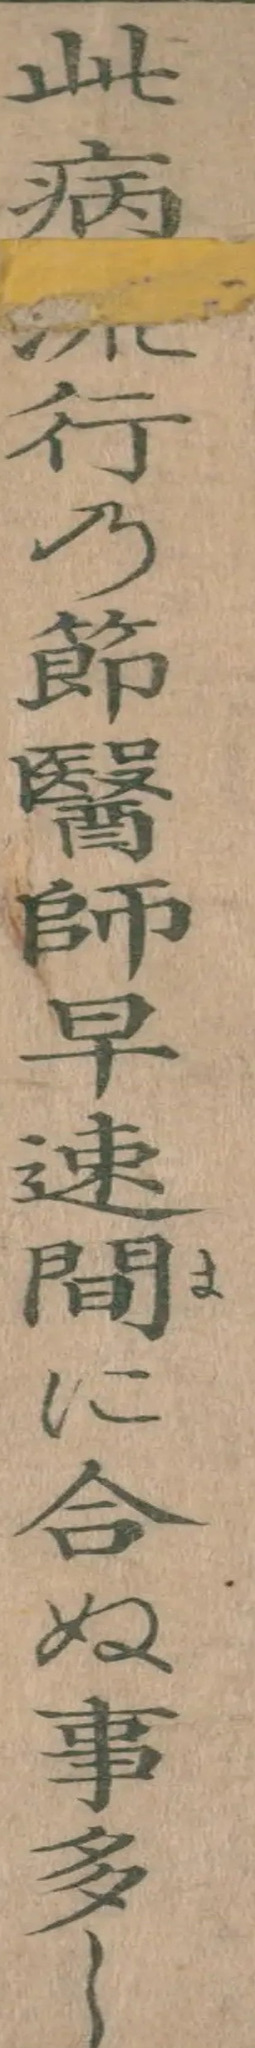此病流行の節医師早速間に合ぬ事多し
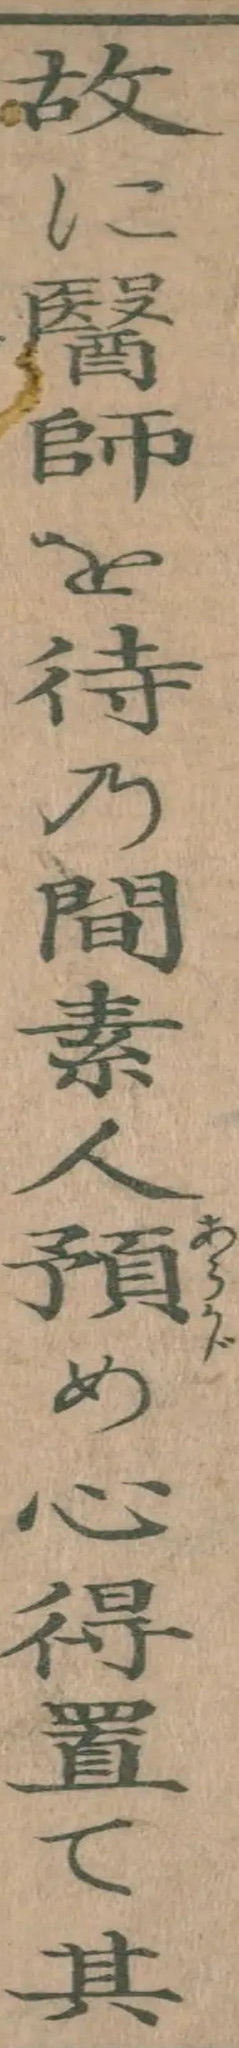故に医師を待の間素人預め心得置て其
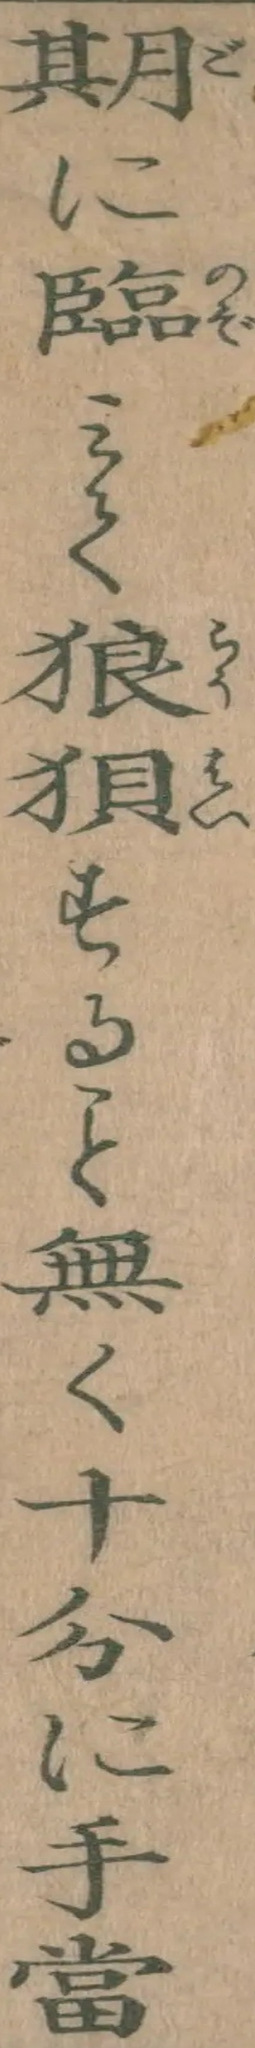期に臨みて狼狽すること無く十分に手当
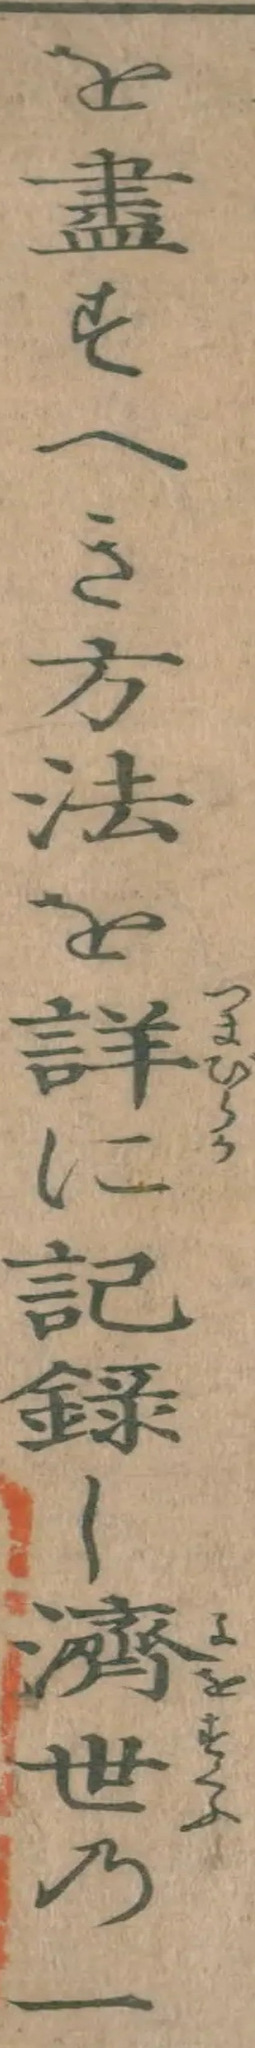を尽すへき方法を詳に記録し済世の一
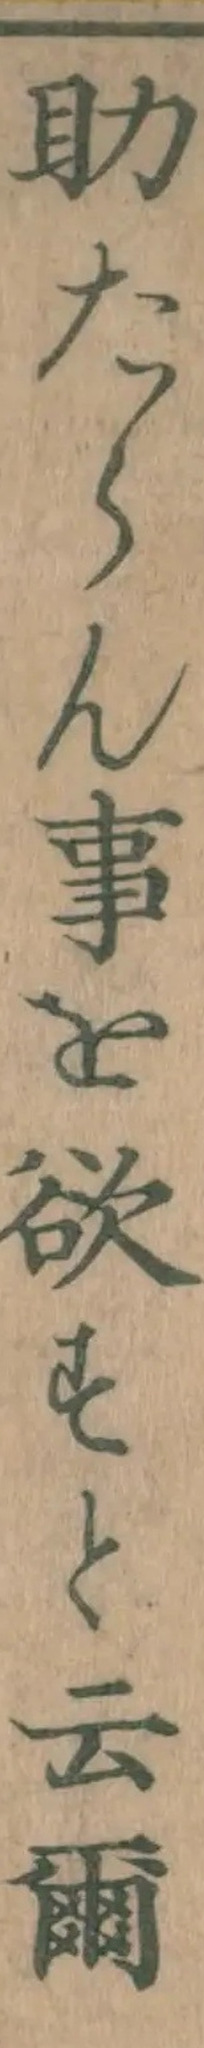助たらん事を欲すと云爾
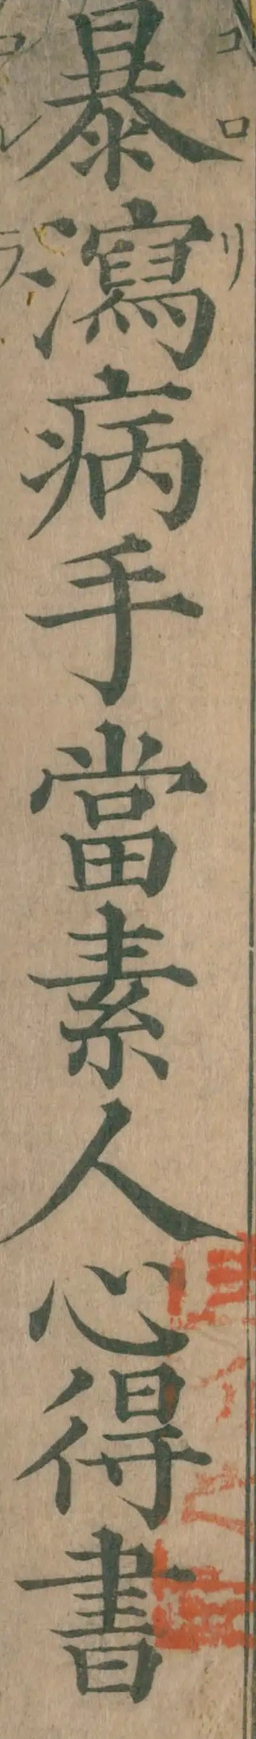暴瀉病手当素人心得書

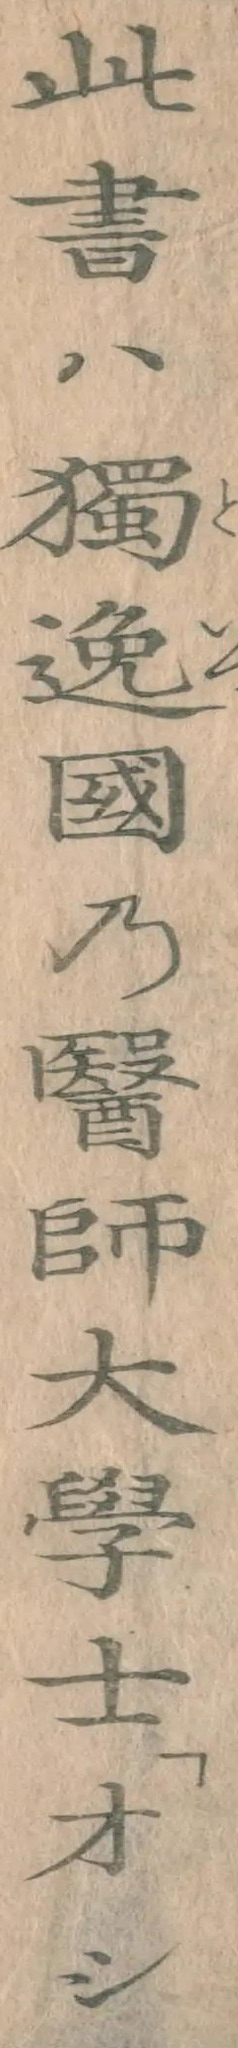此書は独逸国の医師大学士「オシ
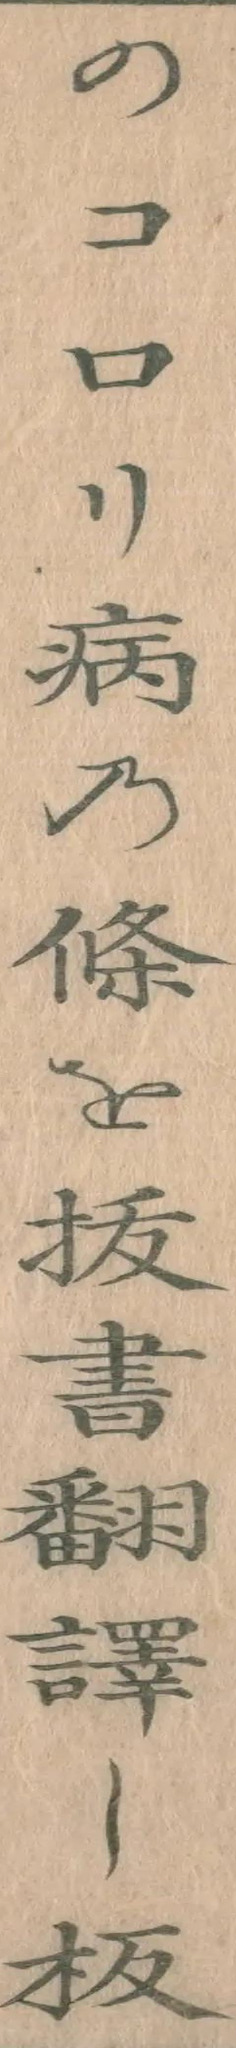のコロリ病の条を抜書翻訳し板
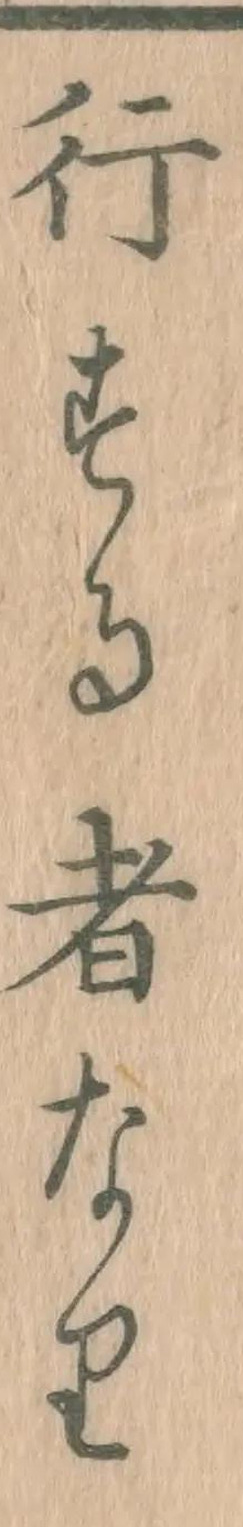行する者なり
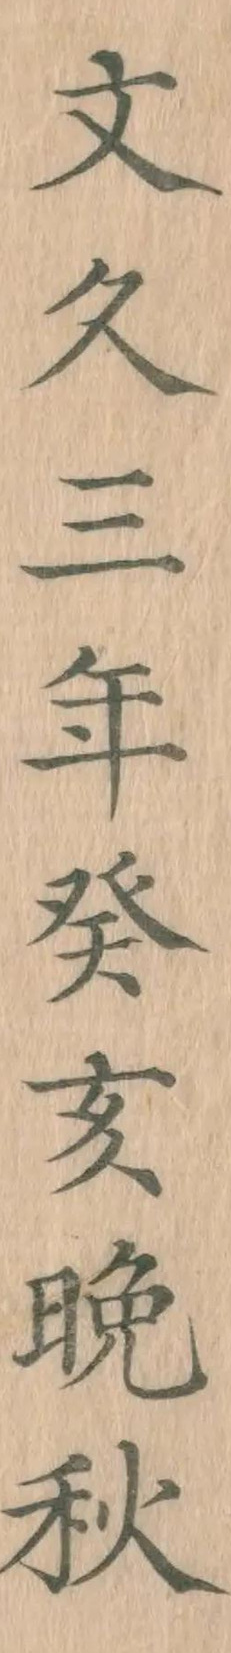文久三年癸亥晩秋
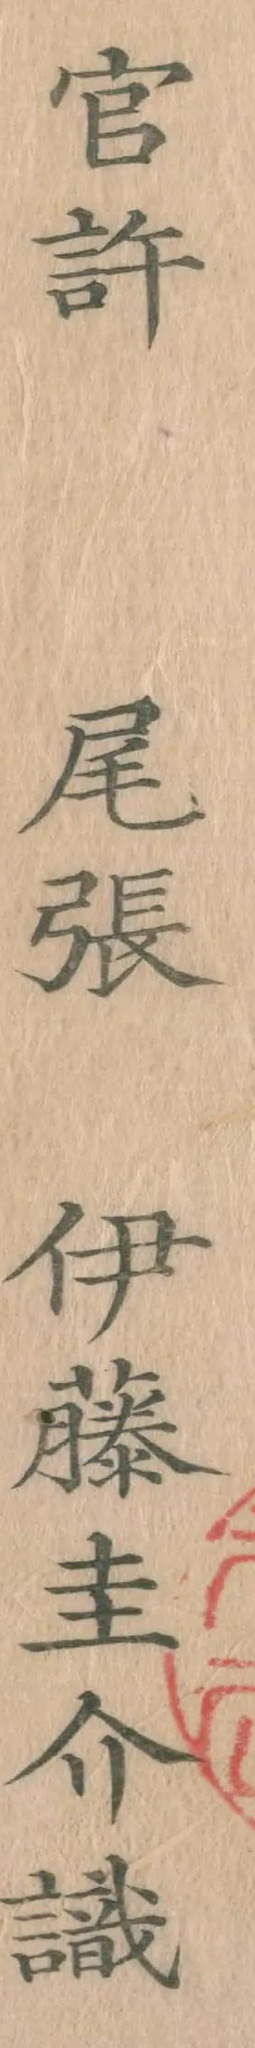官許尾張伊藤圭介識
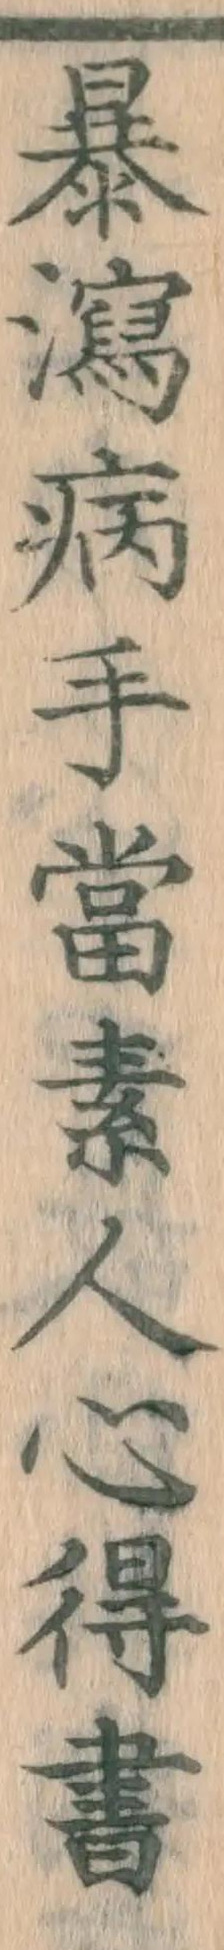暴瀉病手当素人心得書
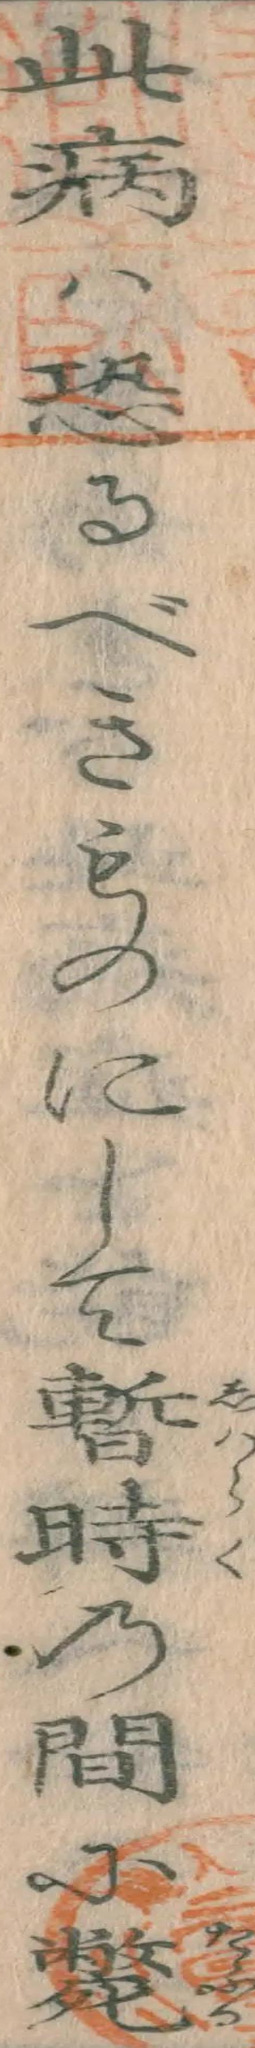此病は恐るべきものにして暫時の間に斃
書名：暴瀉病手当素人心得書
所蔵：国立国会図書館 National Diet Library, JAPAN
